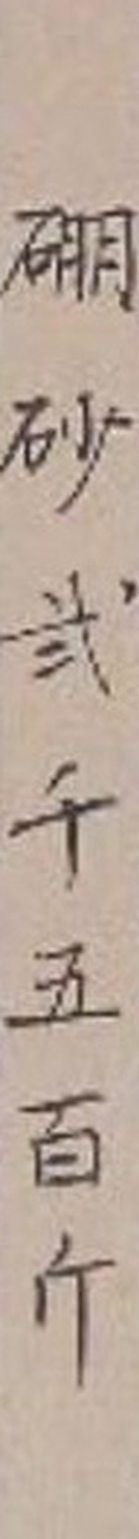硼砂弐千五百斤
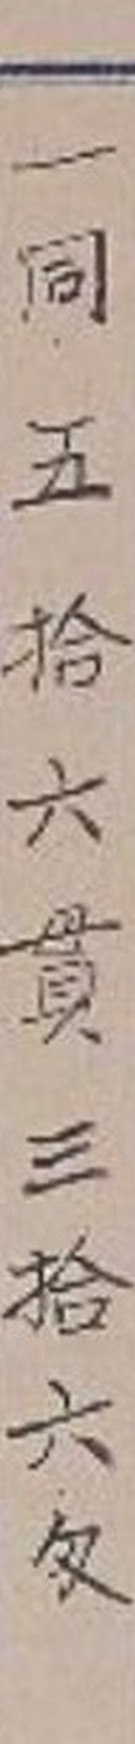一同五拾六貫三拾六匁
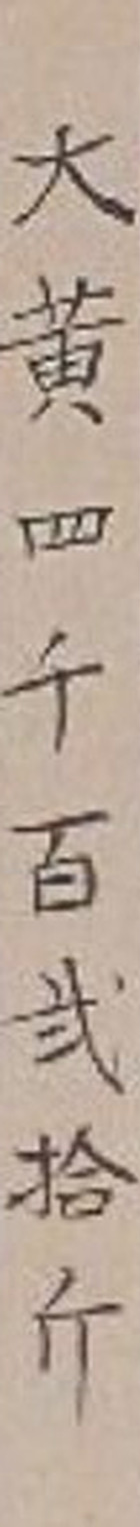大黄四千百弐拾斤
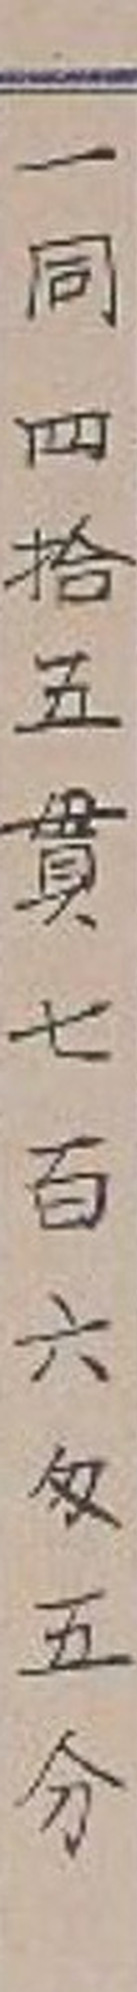一同四拾五貫七百六匁五分
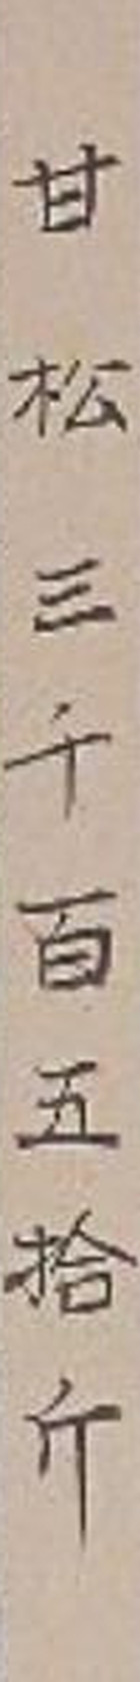甘松三千百五拾斤
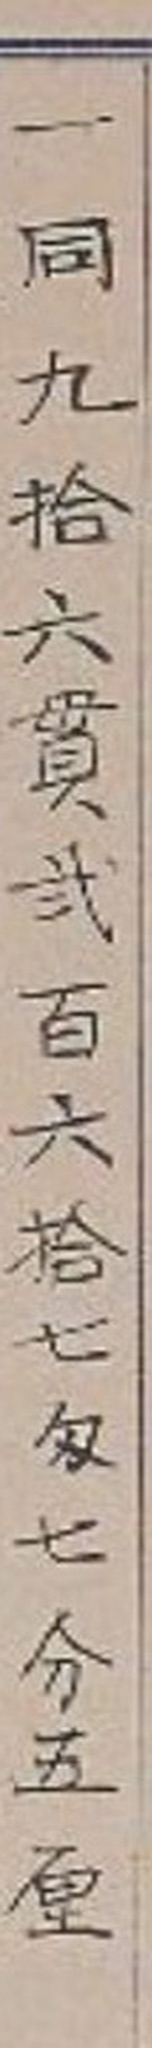一同九拾六貫弐百六拾七匁七分五厘
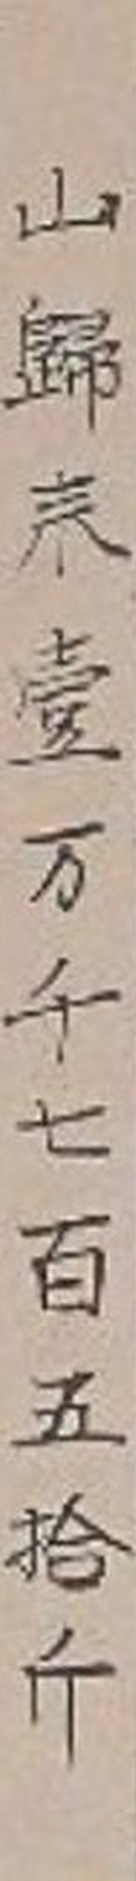山歸来壹万千七百五拾斤
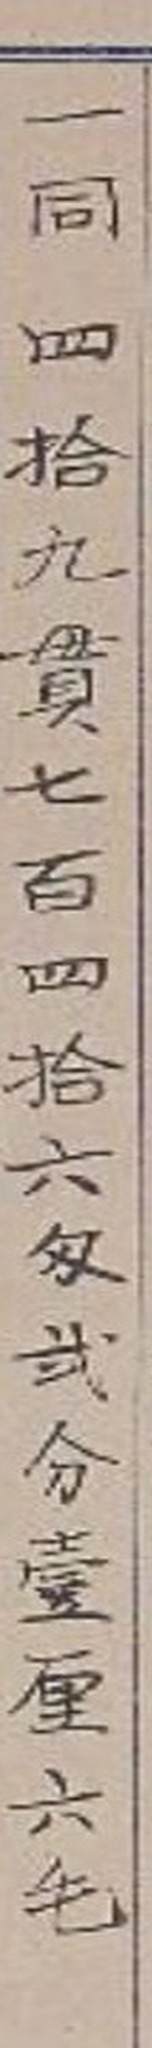一同四拾九貫七百四拾六匁弐分壹厘六毛
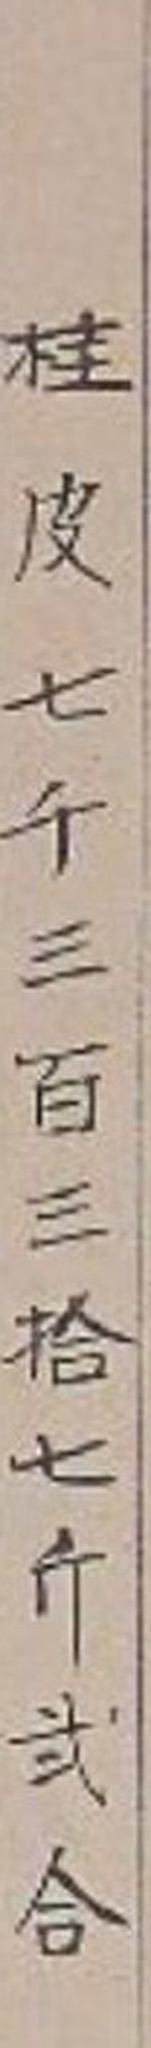桂皮七千三百三拾七斤弐合
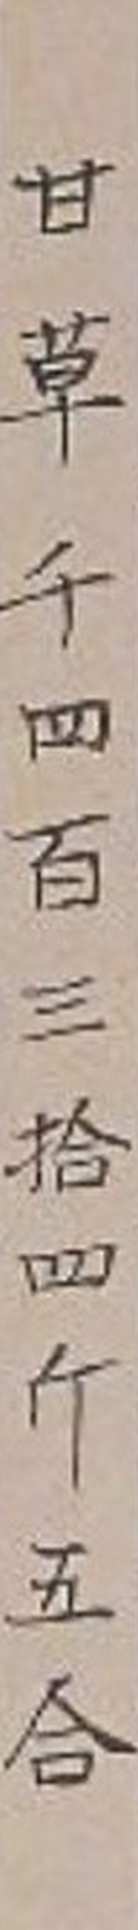甘草千四百三拾四斤五合
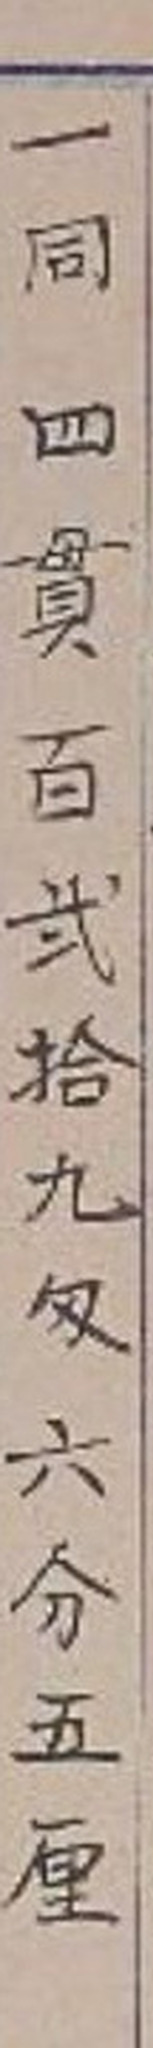一同四貫百弐拾九匁六分五厘
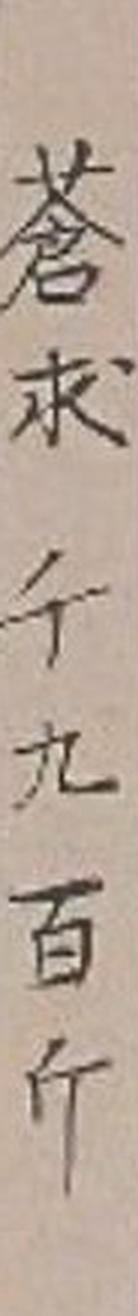蒼求千九百斤
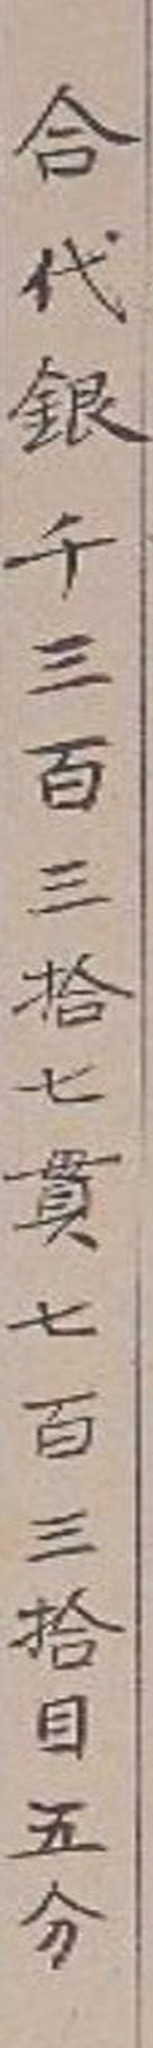合代銀千三百三拾七貫七百三拾目五分
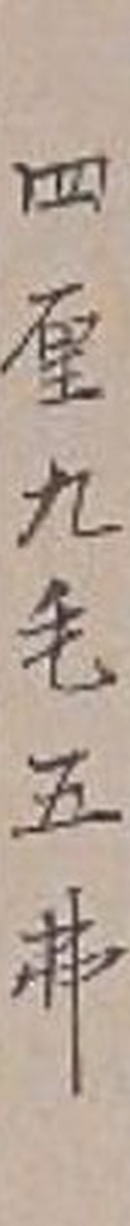四厘九毛五弗

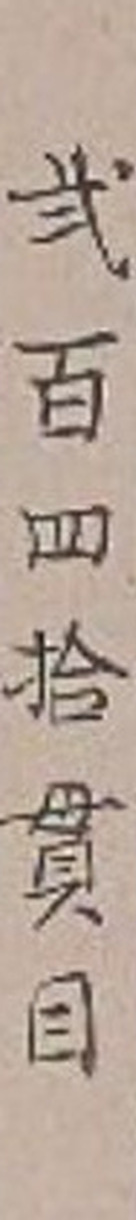弐百四拾貫目
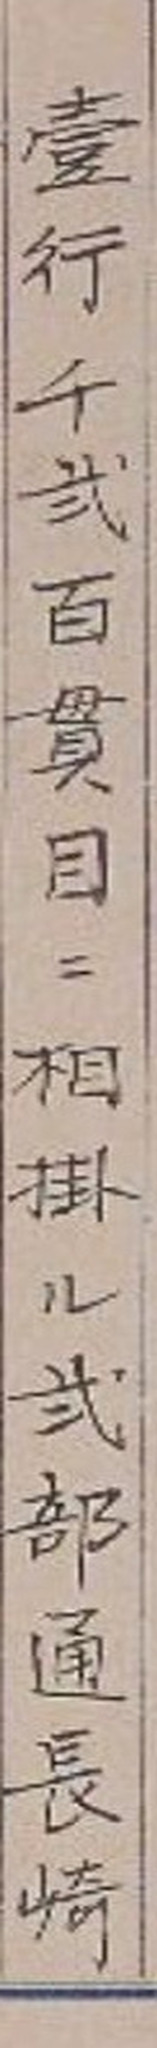壹行千弐百貫目ニ相掛ル弐部通長崎
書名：琉球産物於長崎拂立並本手品利潤総帖 弘化四年より酉年迄
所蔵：University of the Ryukyus Library
